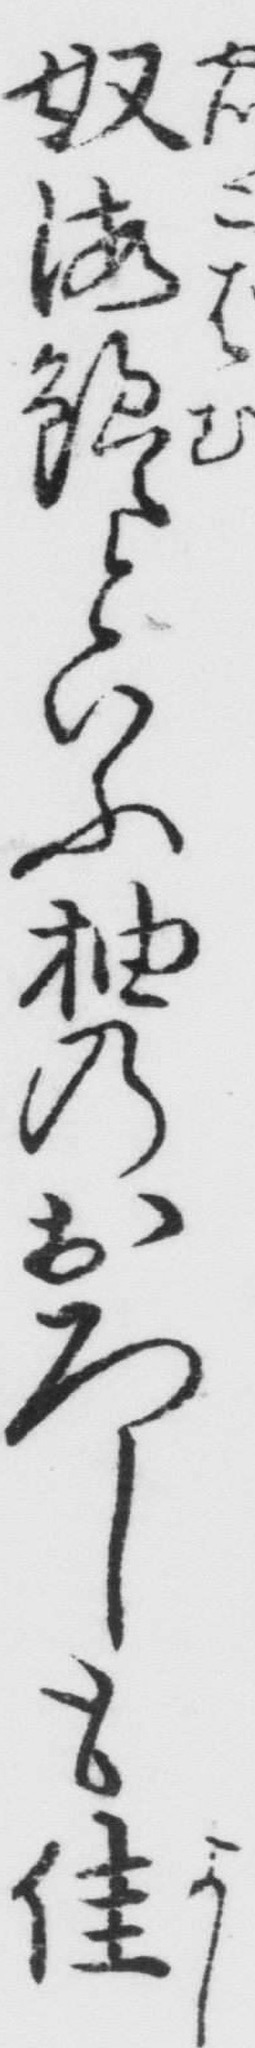奴海鱧といふ柚のおろしも佳
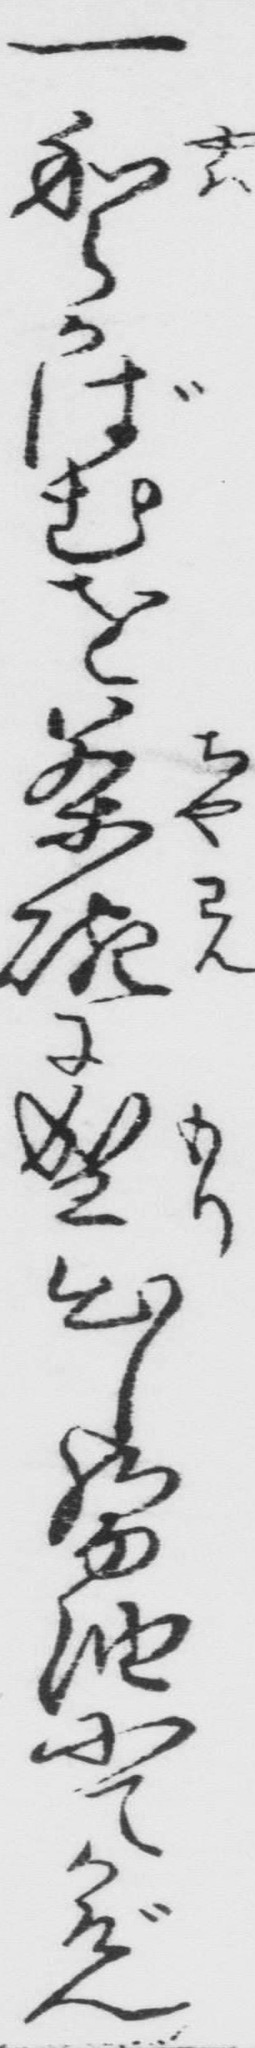一和らかばむを茶碗に盛出し醤油にてかげん
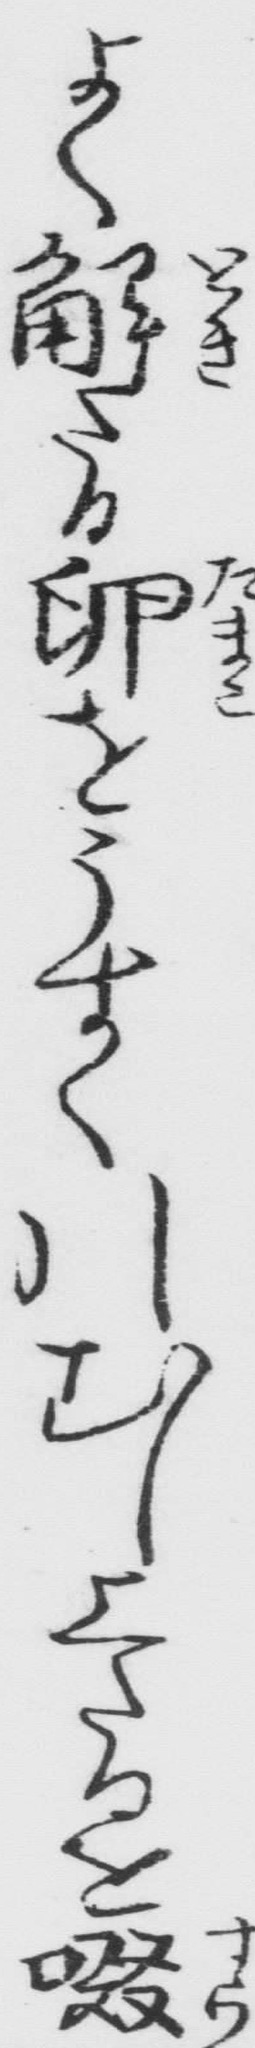よく解たる卵をうすく引むし上たるを啜
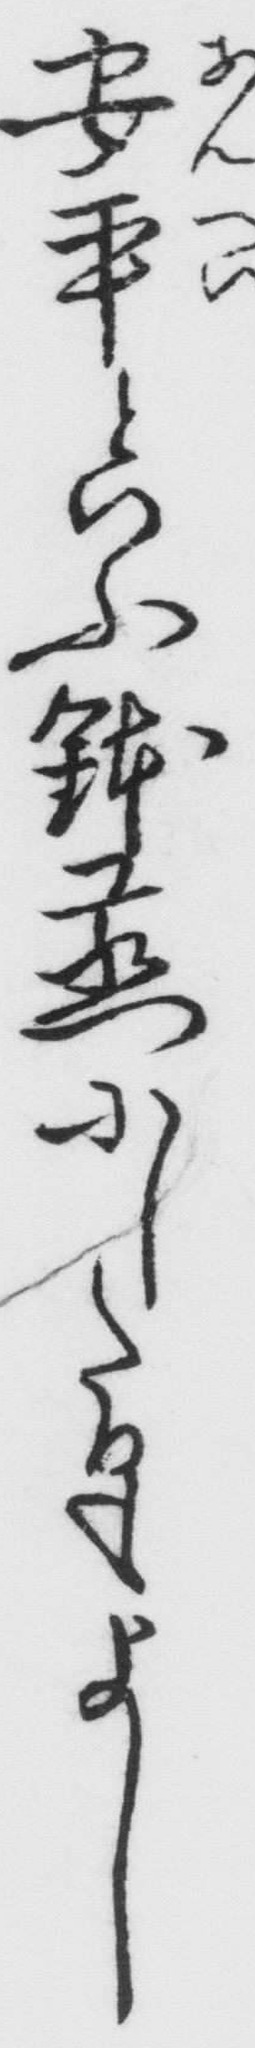安平といふ鉢蒸にしたるもよし

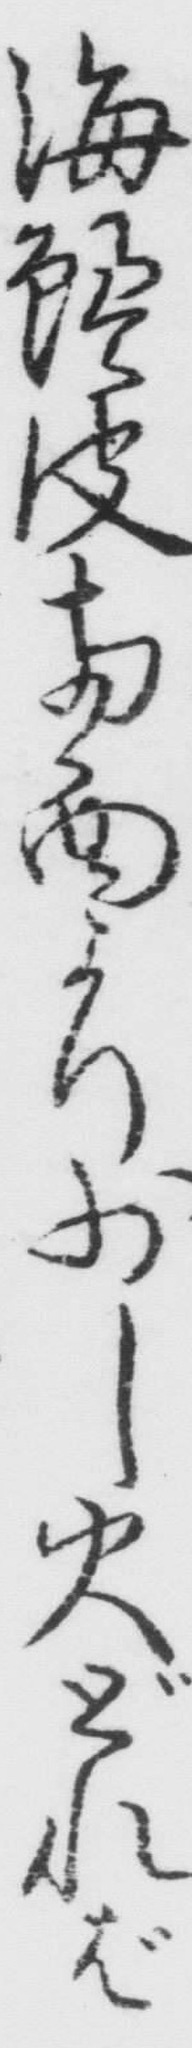海鱧皮両面より少し火どれば
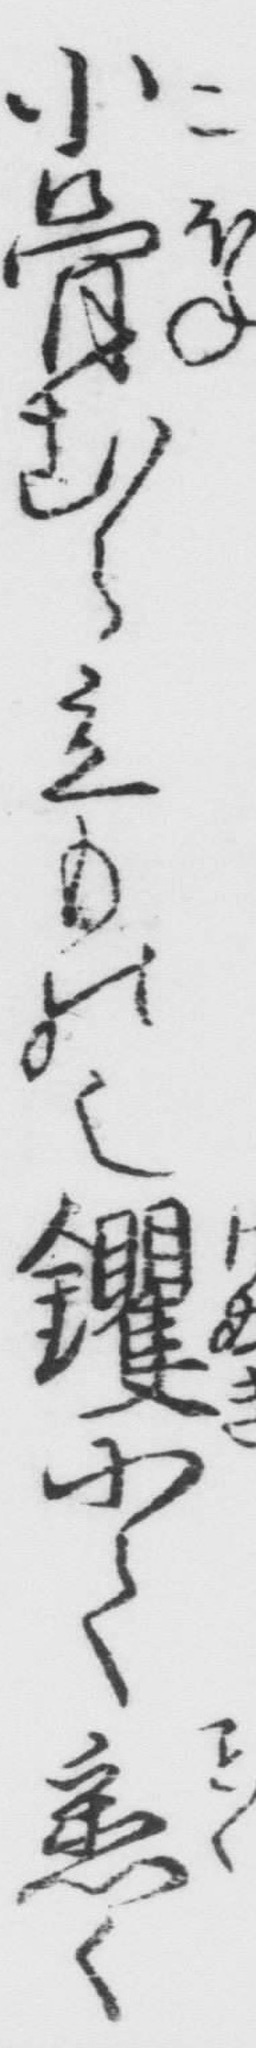小骨むら立もの也钁にて悉く
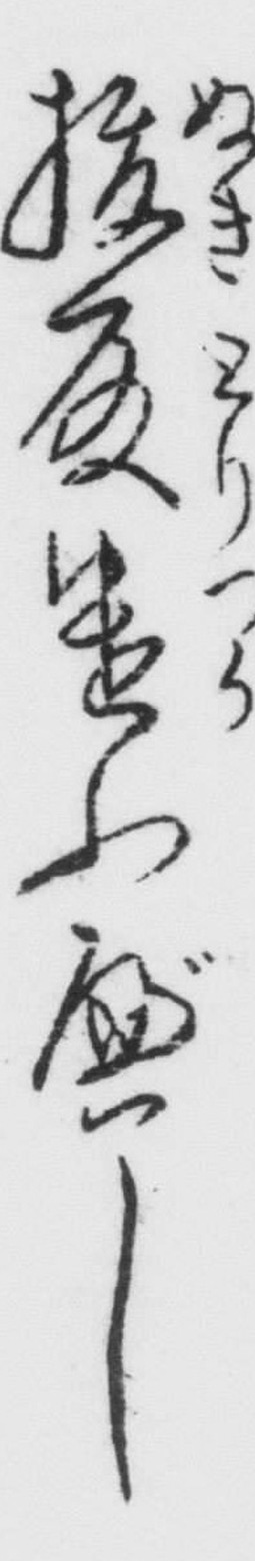抜取遣ふべし
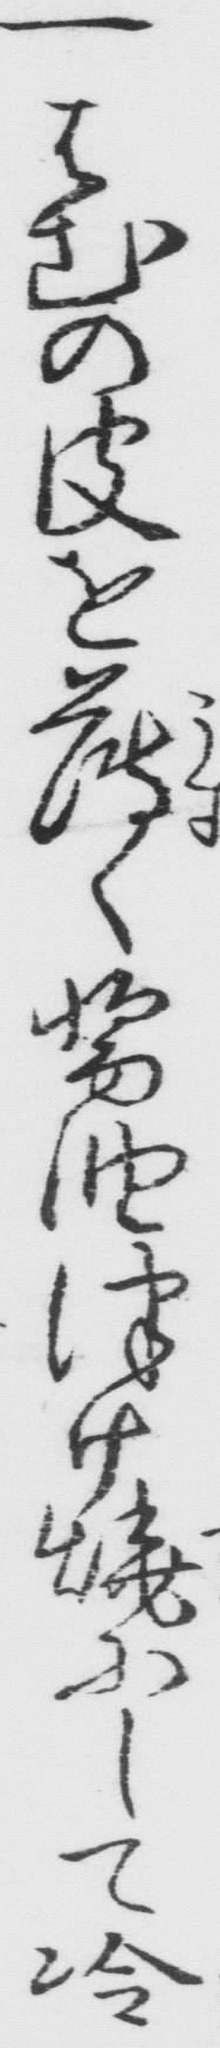一はむの皮を薄く醤油つけ焼にして冷
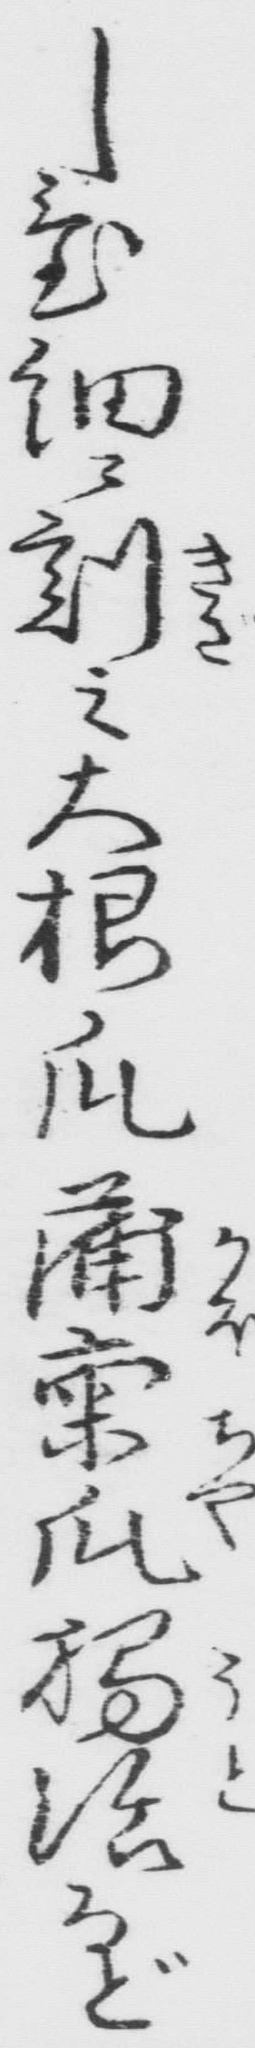し置細々刻み大根瓜蒲栗瓜独活など
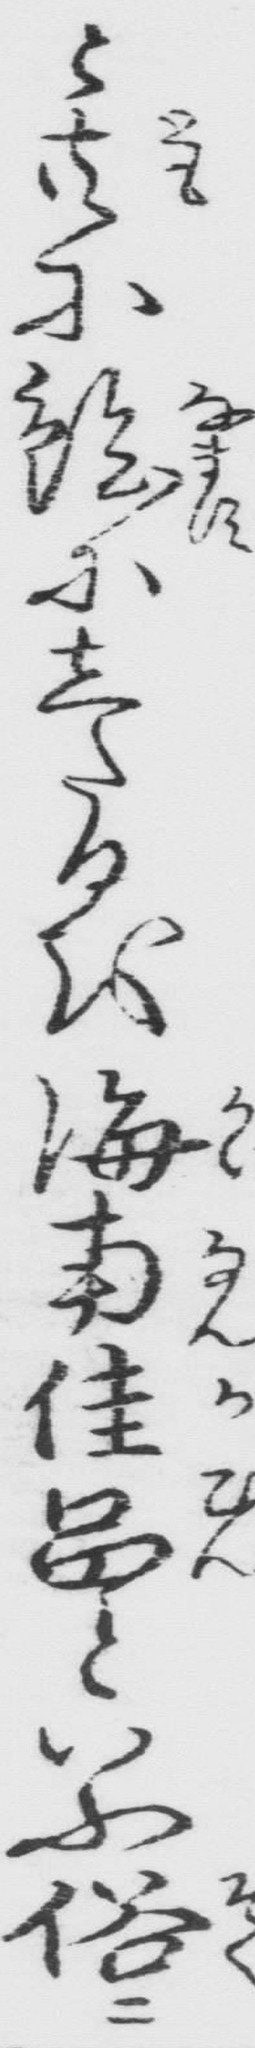と共に鱠にしたるを海南佳品といふ俗に
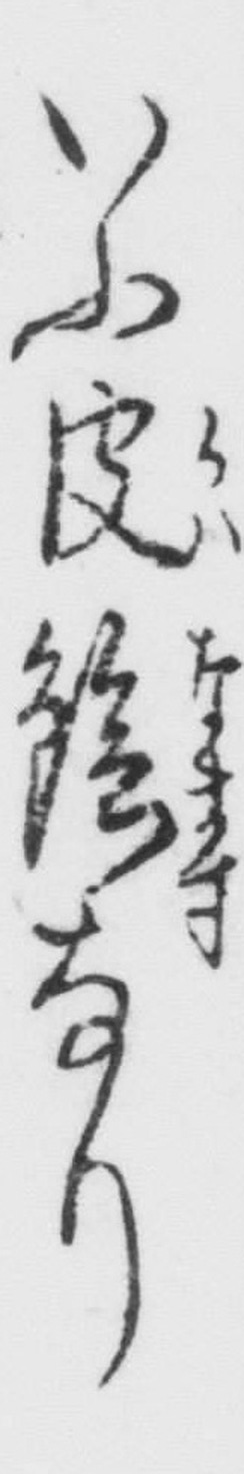いふ皮鱠なり
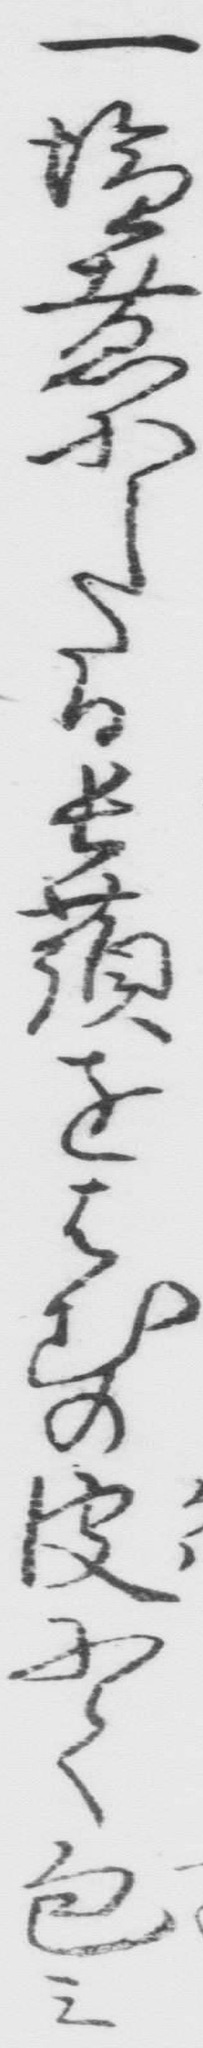一塩煮にしたる長蕷をはむの皮にて包み
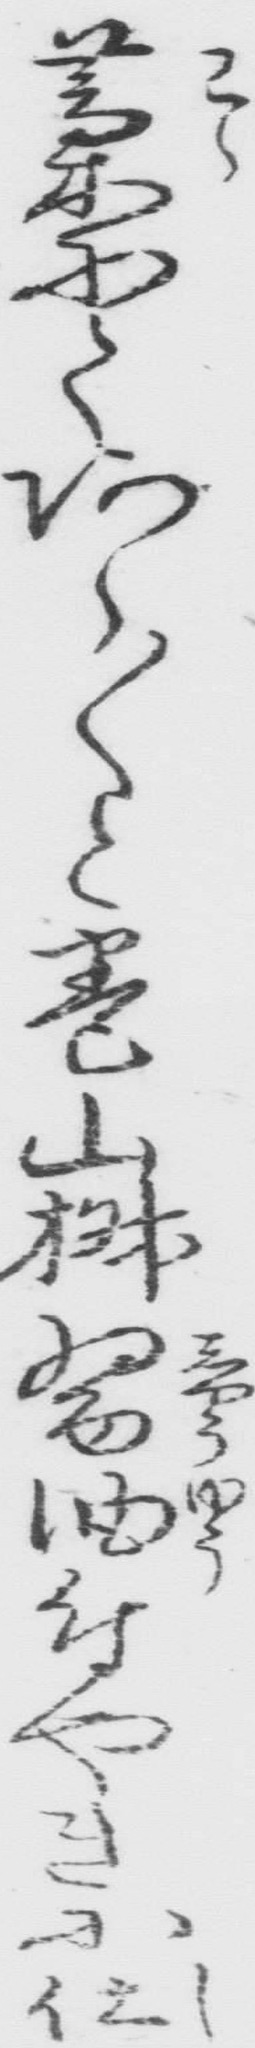藁にてあら〳〵と巻山椒醤油付やきに仕
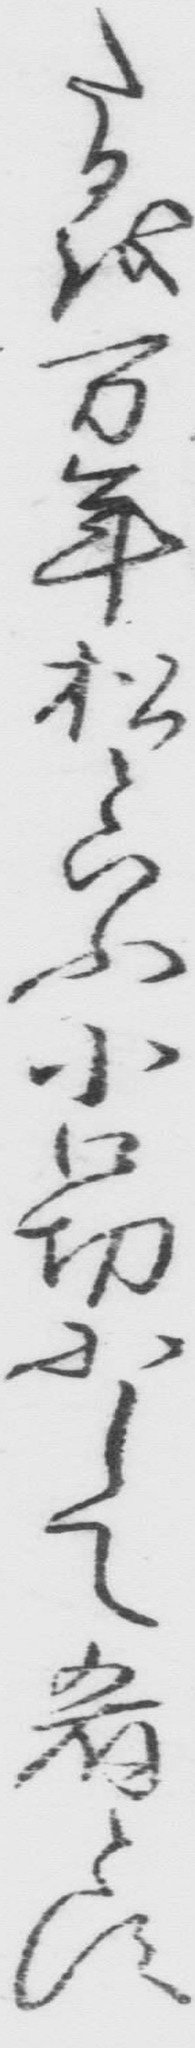たるを万年松といふ小口切にして肴とす
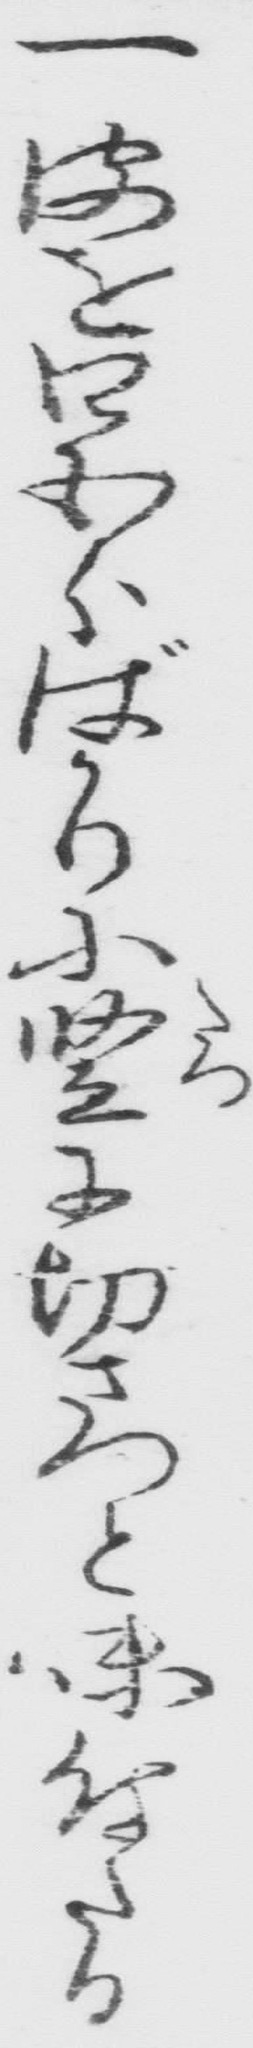一皮を四五分ばかりに竪に切さつと味付たる
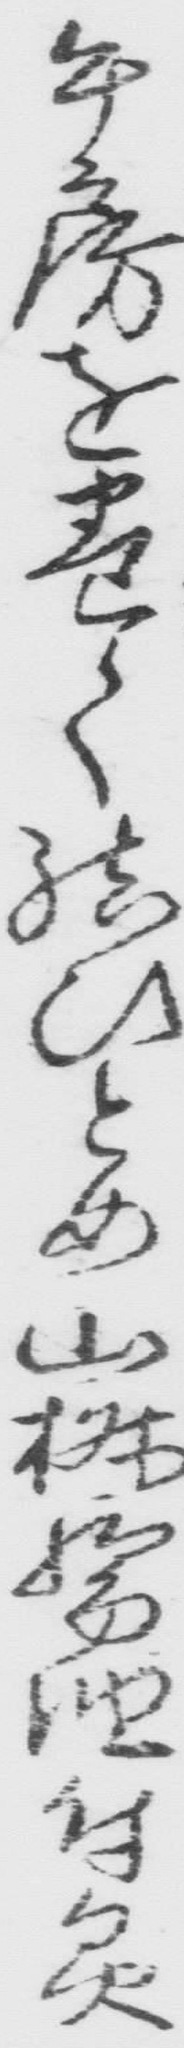牛蒡を巻て結ひとめ山椒醤油付炙
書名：海鰻百珍
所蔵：大阪府立大学学術情報センター 国文学研究資料館
